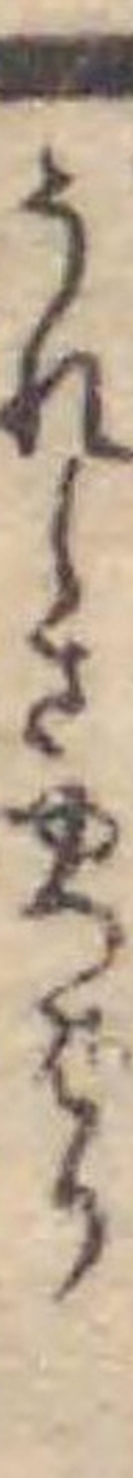うれしさやつぱり
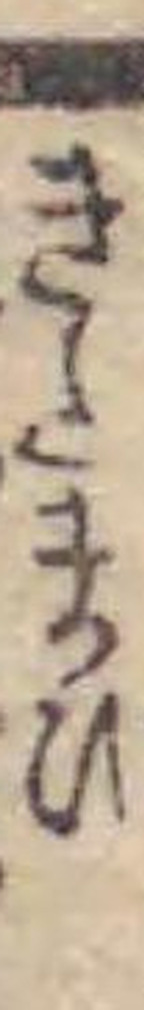きたまひ
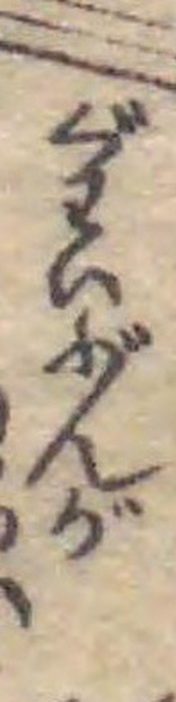ぐわいぶんが
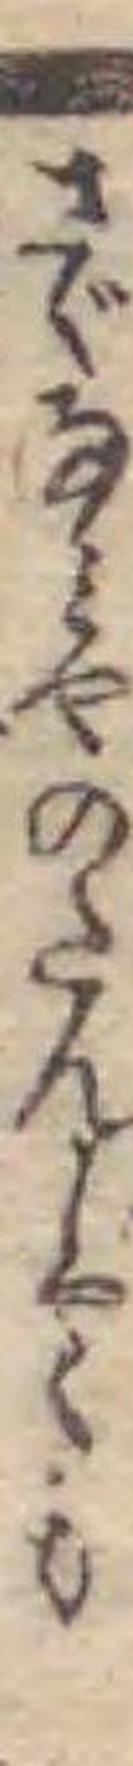さゞなみやのたんじやくも
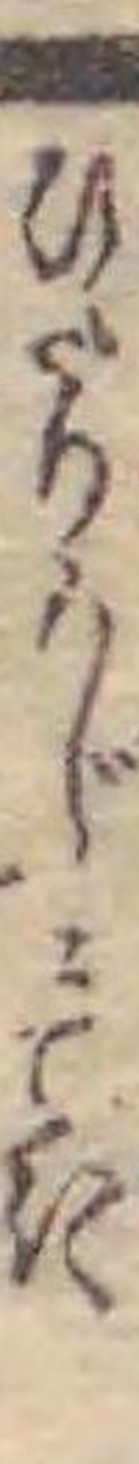ひだりもじにてき
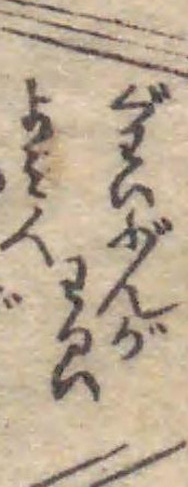ぐわいぶんが
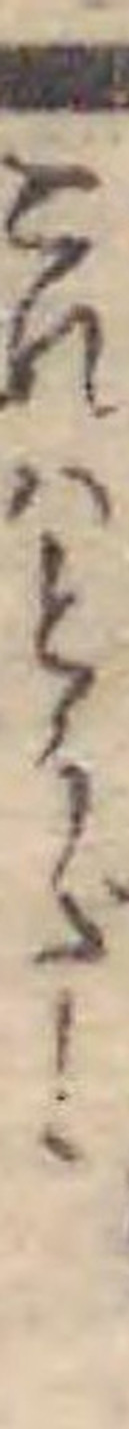これはとうだと
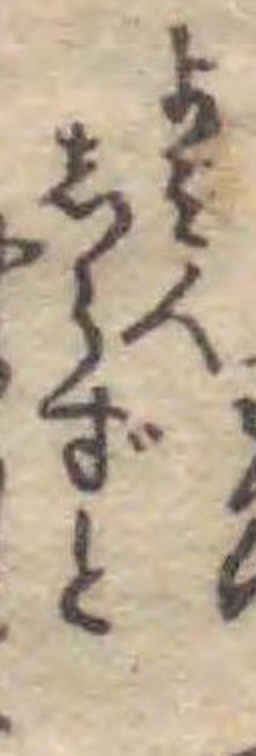しらずと
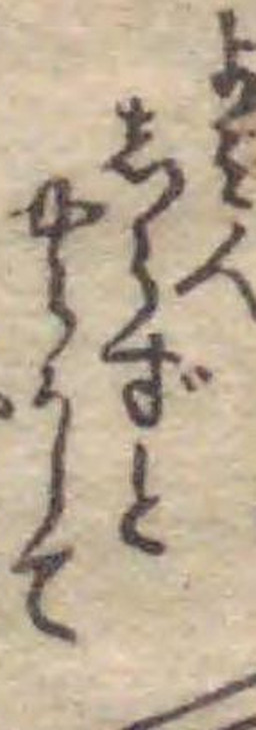しらずと
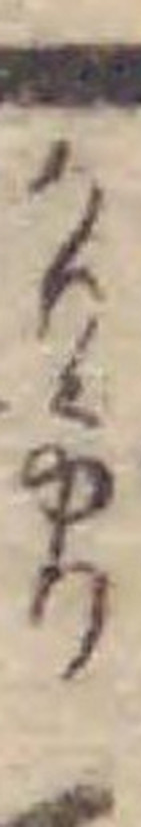かりにやり
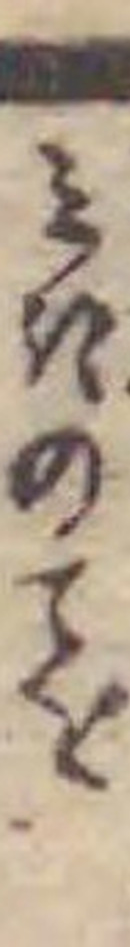みきのてを
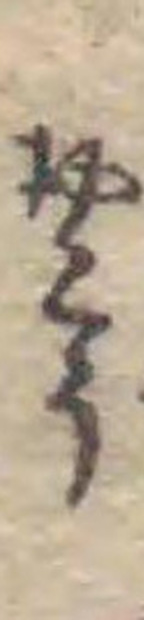おこう
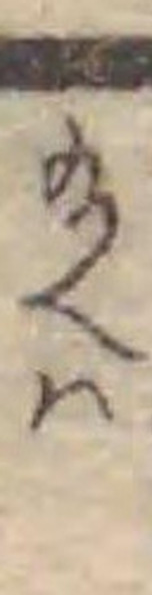給へは
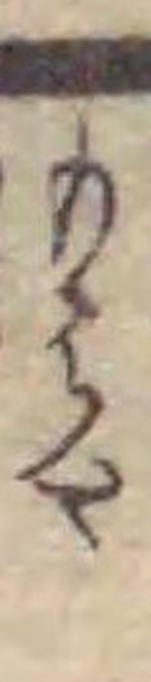もはや
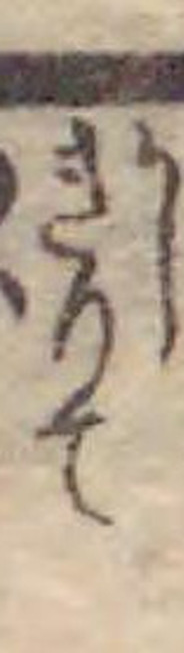きりて
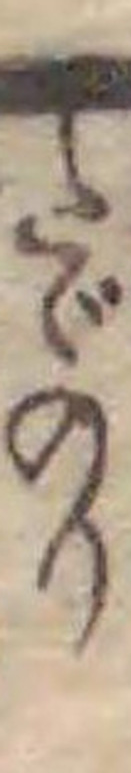たゞのり
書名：大悲の千六本 : 1巻
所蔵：国立国会図書館 National Diet Library, JAPAN
